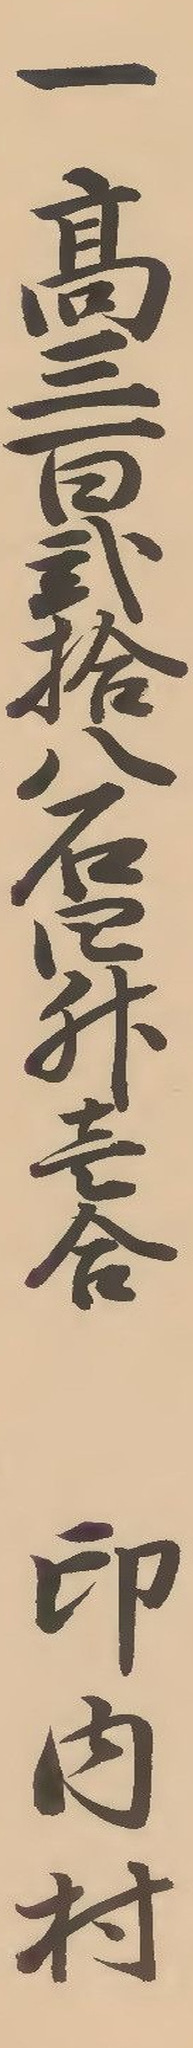一高三百弐拾八石四升壱合印内村

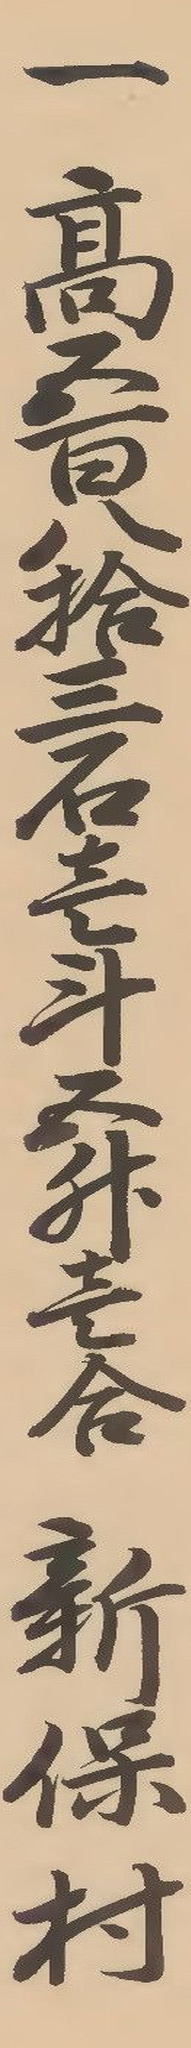一高五百八拾三石壱斗五升壱合新保村
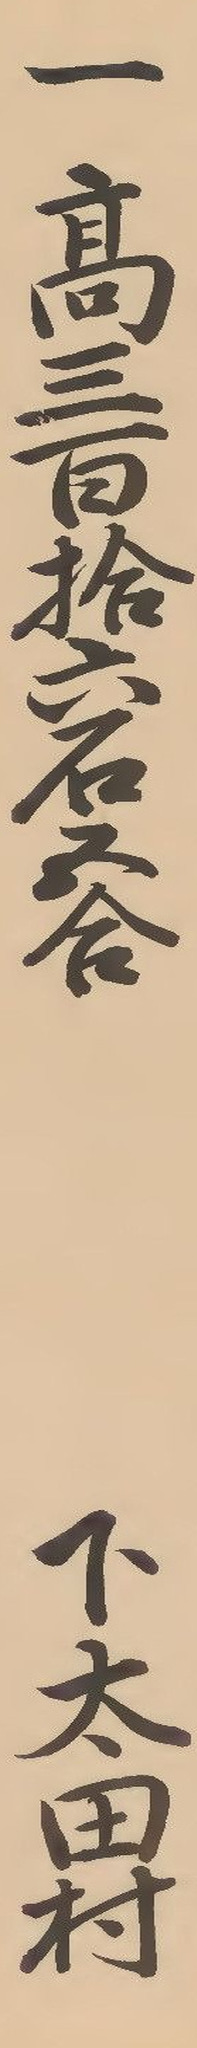一高三百拾六石五合下太田村
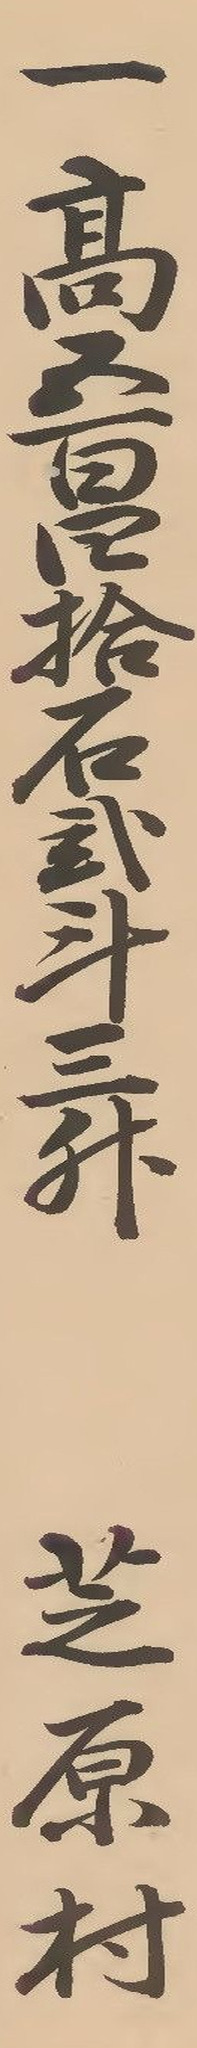一高五百四拾石弐斗三升芝原村
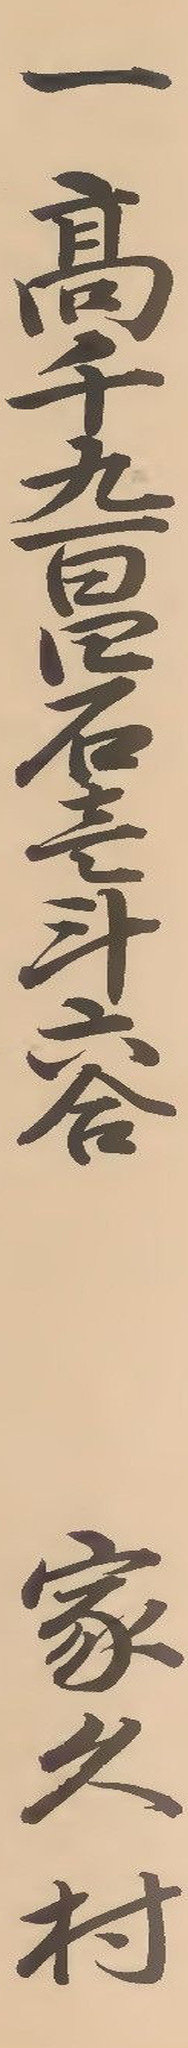一高千九百四石壱斗六合家久村
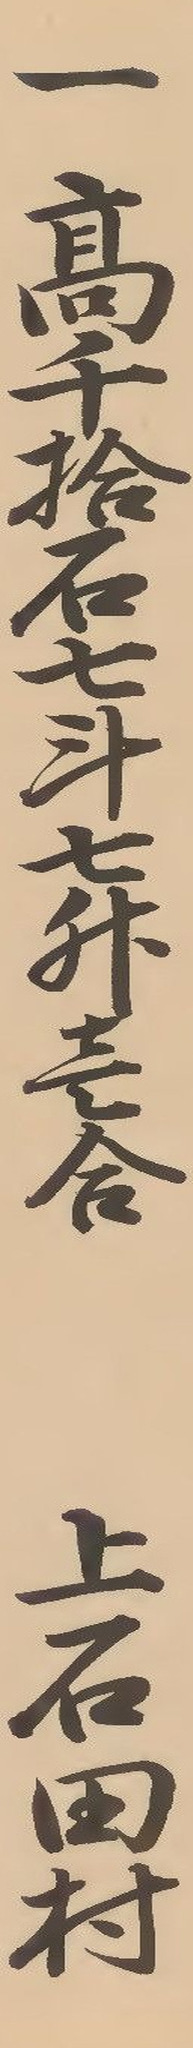一高千拾石七斗七升壱合上石田村
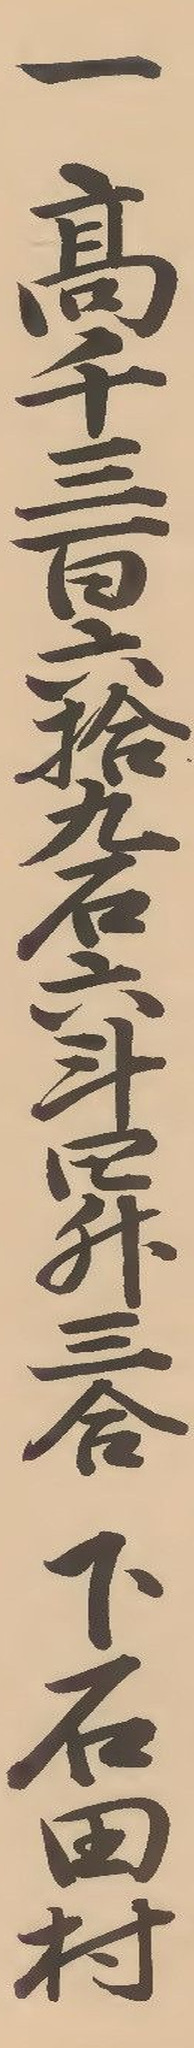一高千三百六拾九石六斗四升三合下石田村
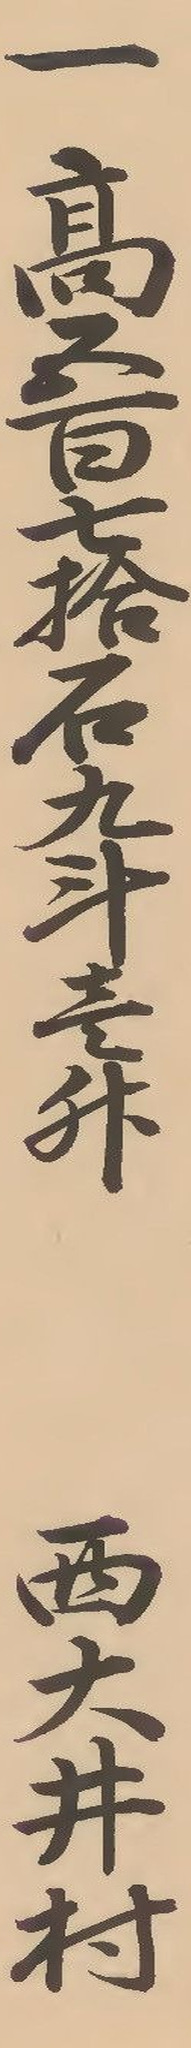一高五百七拾石九斗壱升西大井村

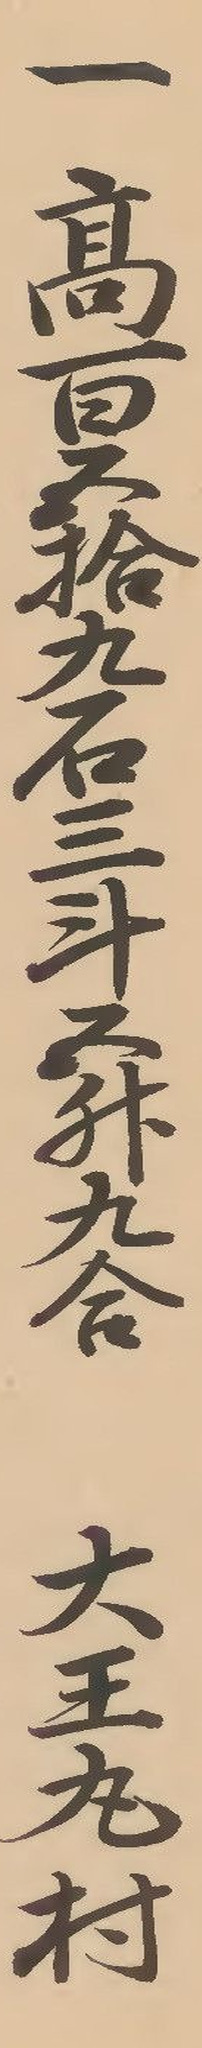一高百五拾九石三斗五升九合大王丸村
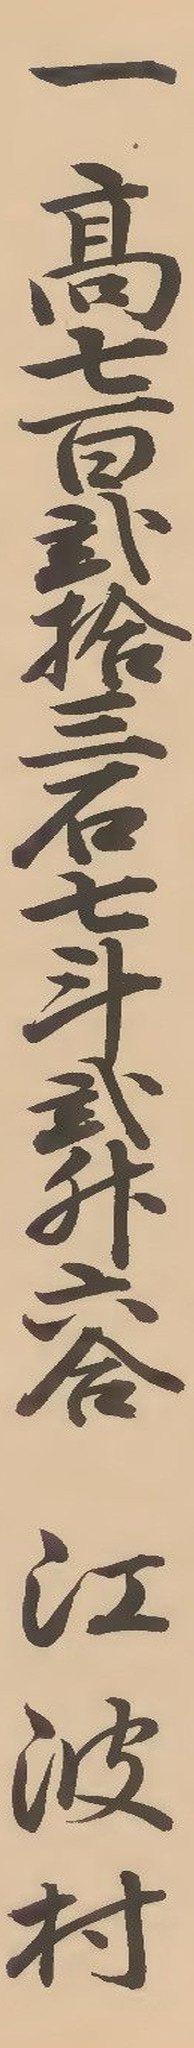一高七百弐拾三石七斗弐升六合江波村
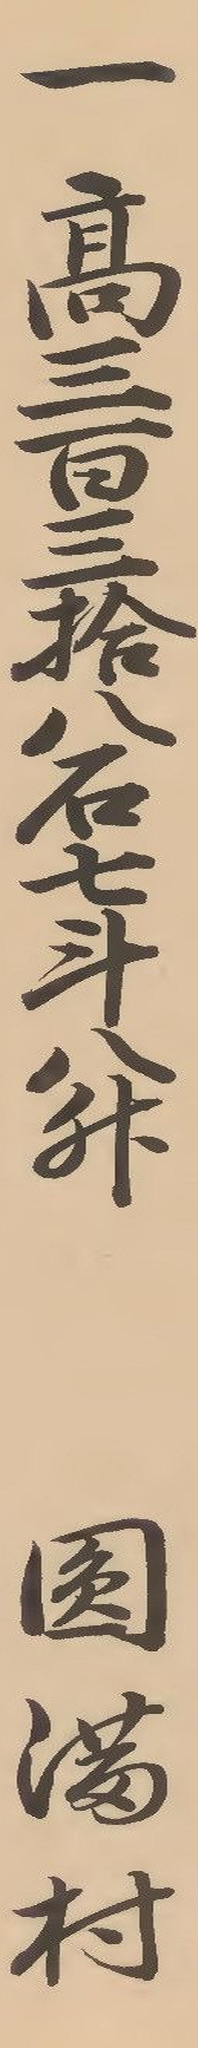一高三百三拾八石七斗八升円満村
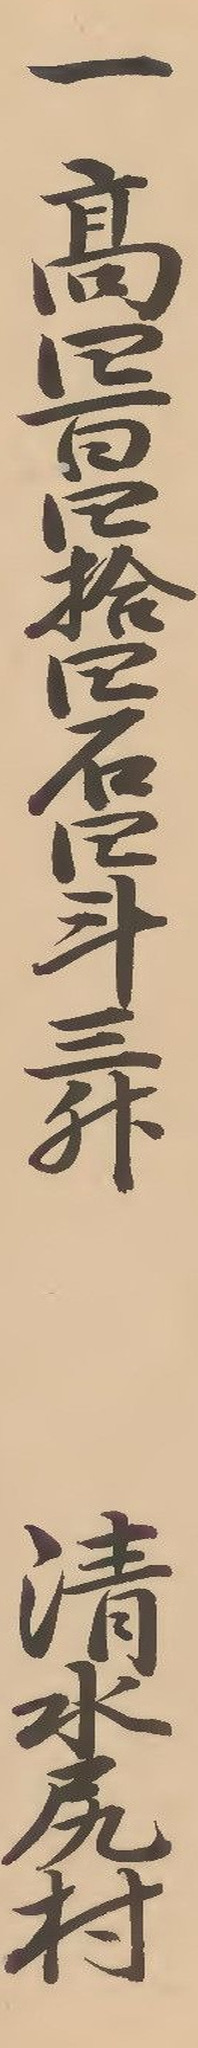一高四百四拾四石四斗三升清水尻村
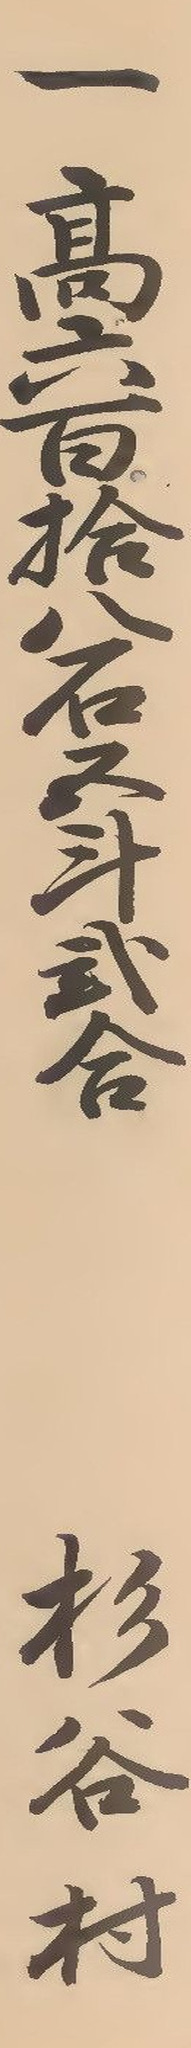一高六百拾八石五斗弐合杉谷村
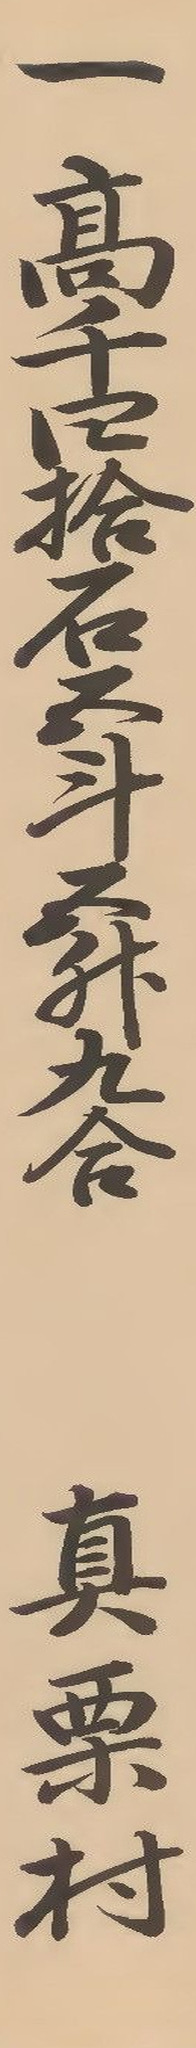一高千四拾石五斗五升九合真栗村
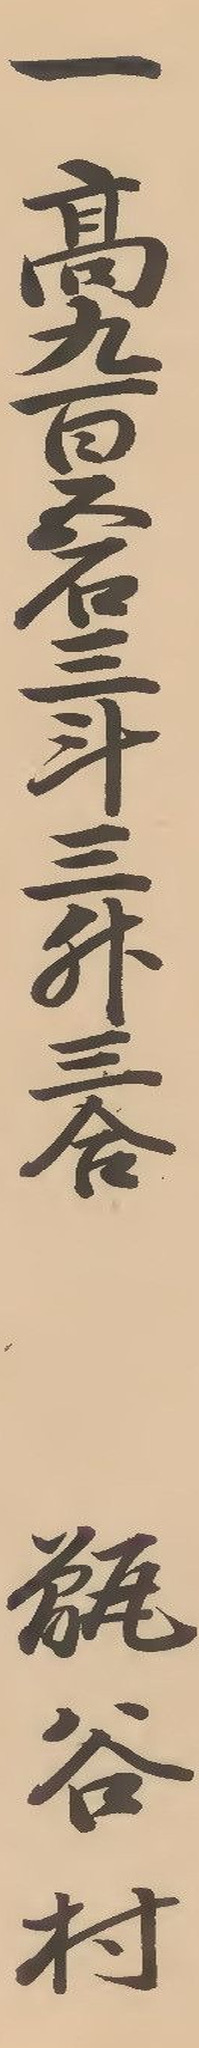一高九百五石三斗三升三合甑谷村
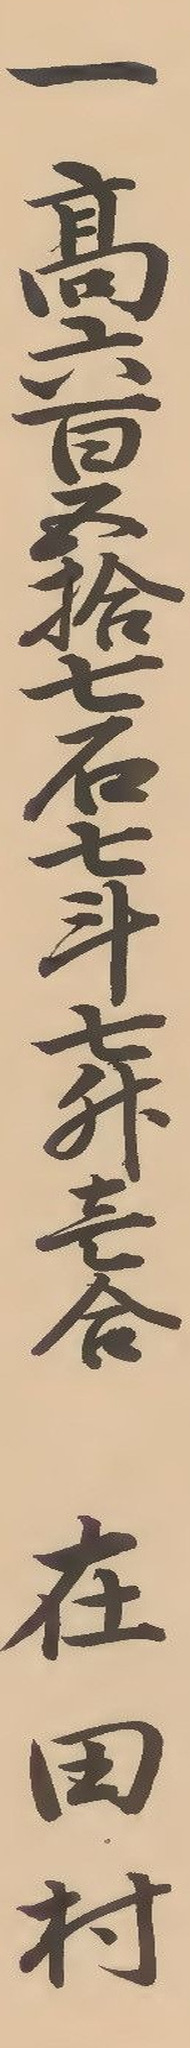一高六百五拾七石七斗七升壱合在田村
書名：越前国郷帳
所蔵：国立公文書館 National Archives of Japan
